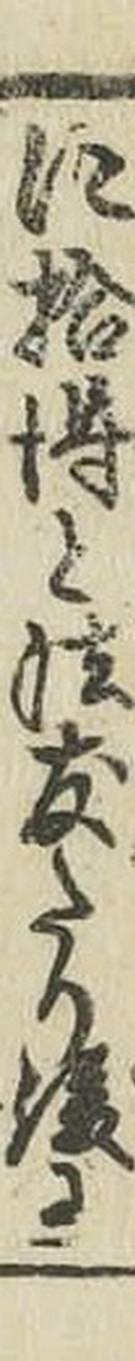に拾得と法友たり後に
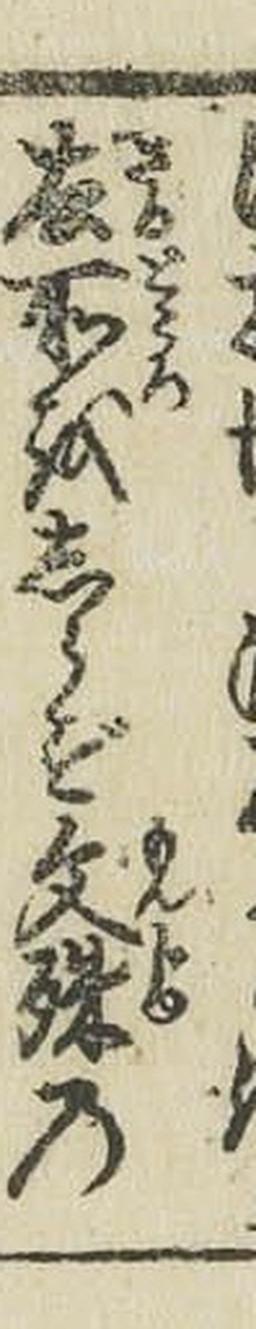去所をしらず文殊の
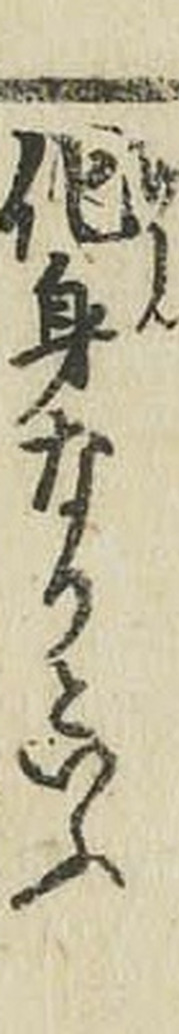化身なりといふ
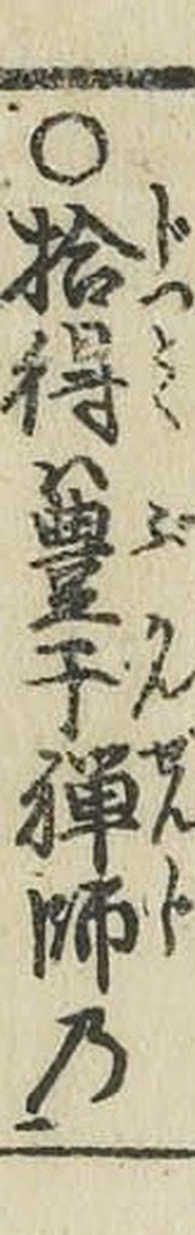○拾得は豊干禅師の
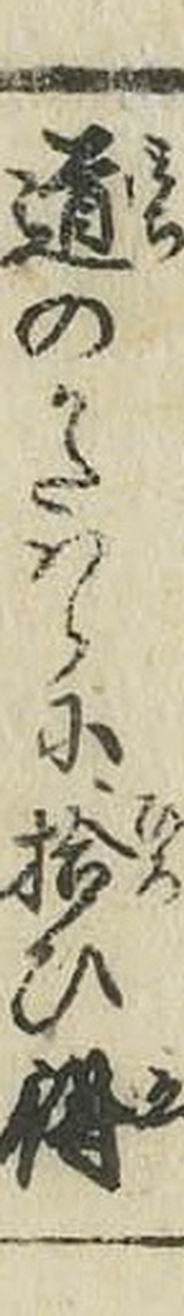道のかたはらに拾ひ得
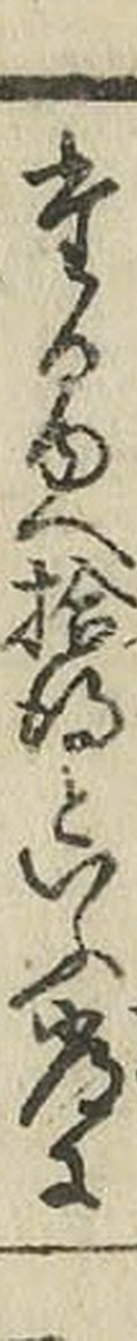たるゆへ拾得といふ常に
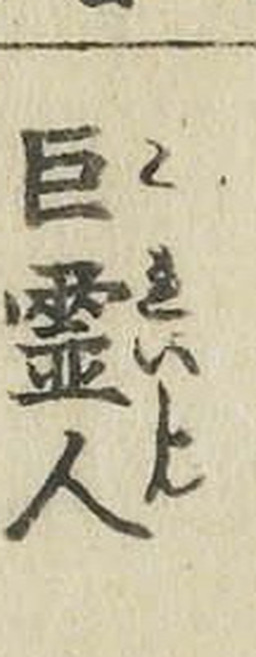巨霊人
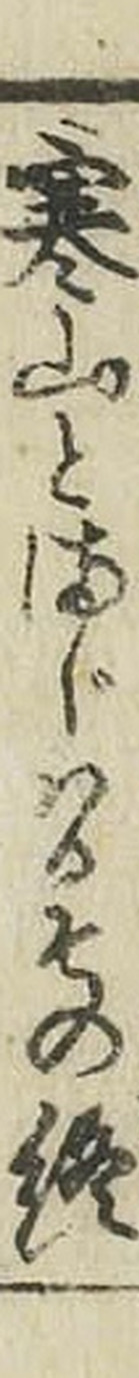寒山とまじはるその終
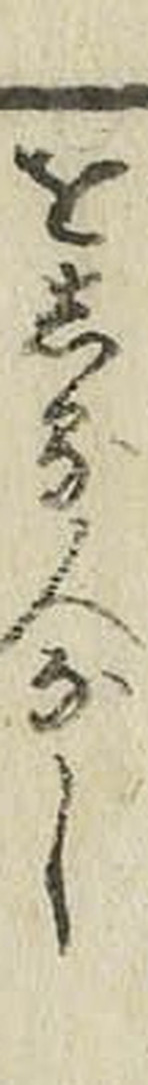をしる人なし
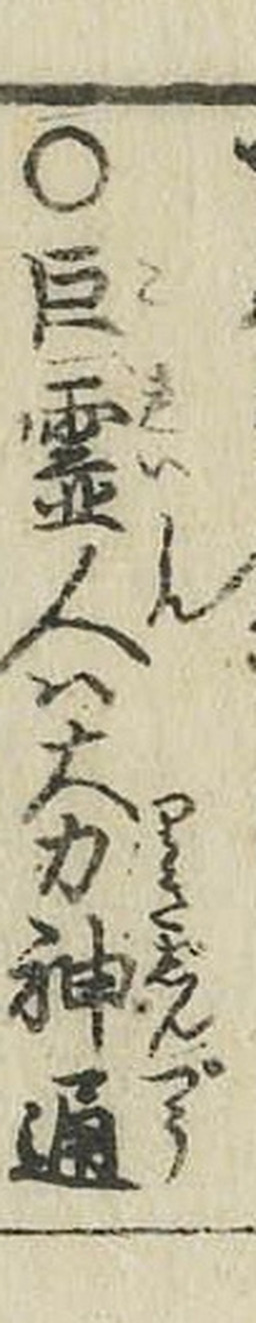○巨霊人は大力神通
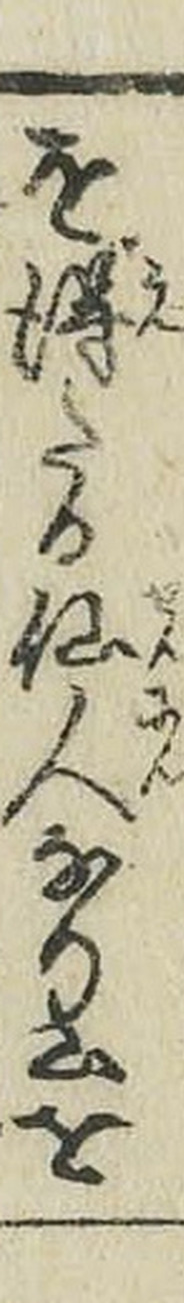を得たる仙人なり山を
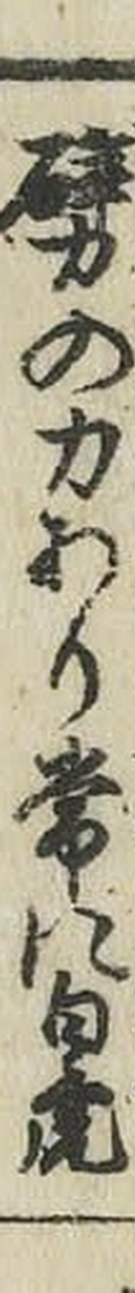劈の力あり常に白虎
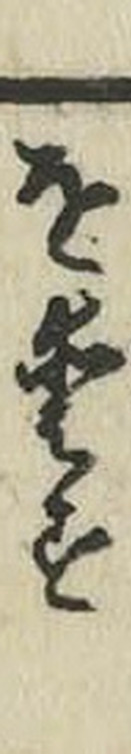を愛す

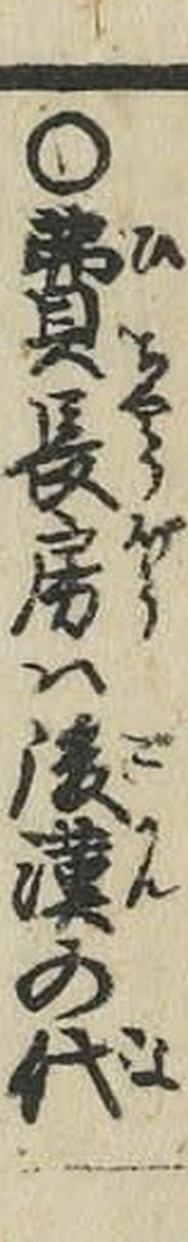○費長房は後漢の代
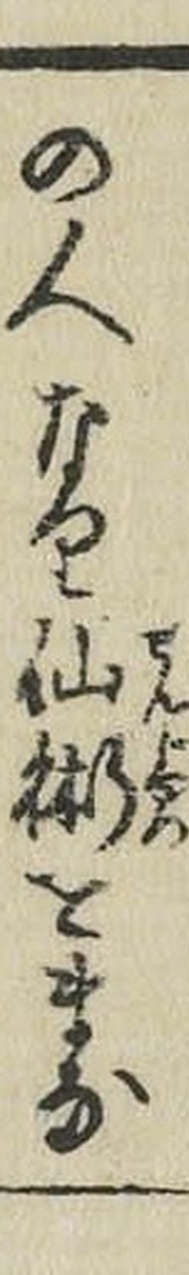の人なり仙術をまな
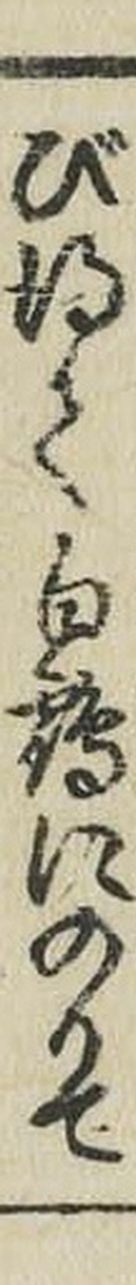び得て白鶴にのりて
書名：増補頭書訓蒙図彙大成 10巻 10:巻之21
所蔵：東京学芸大学教育コンテンツアーカイブ
